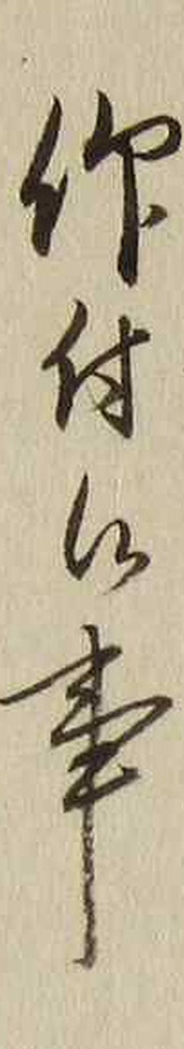仰付候事
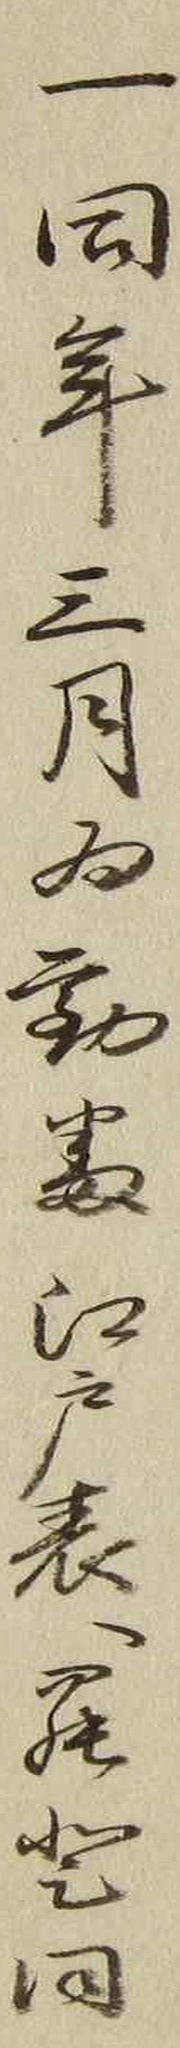一同年三月為勤番江戸表罷登同
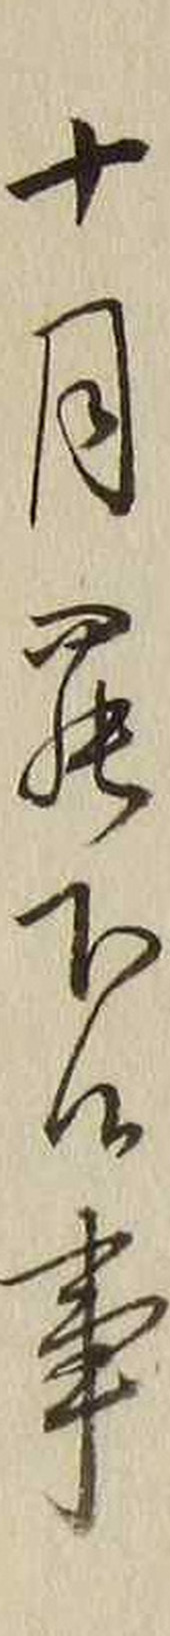十月罷下候事
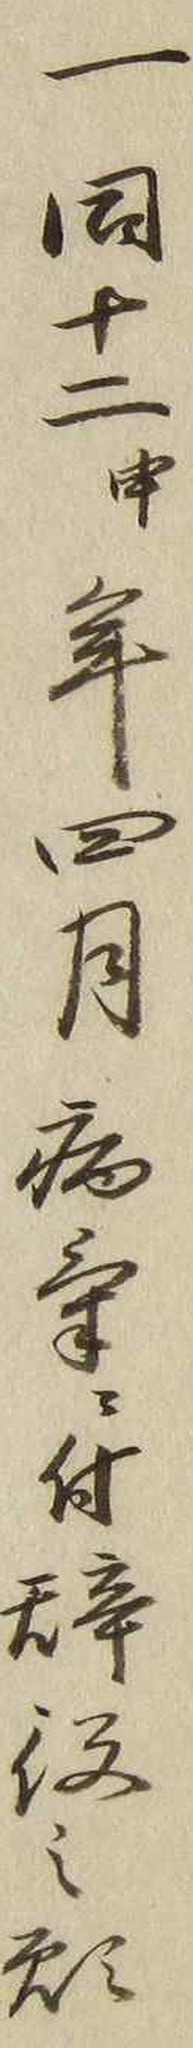一同十二申年四月病気に付辞役之願
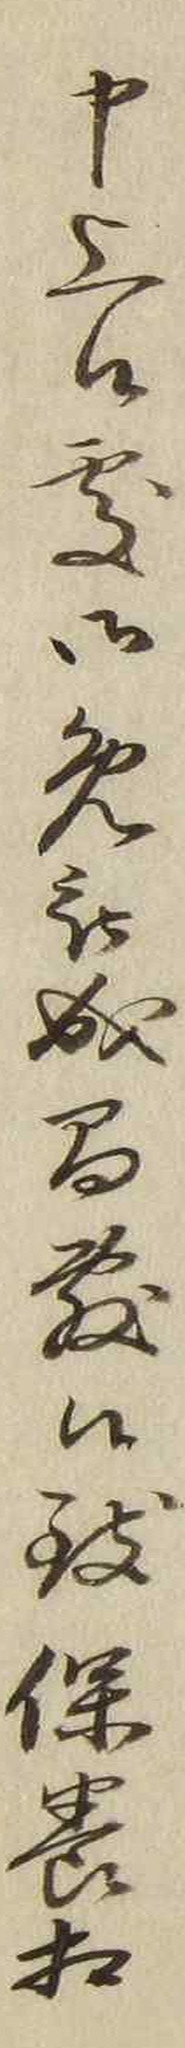申上候処御免被成間敷候致保養相

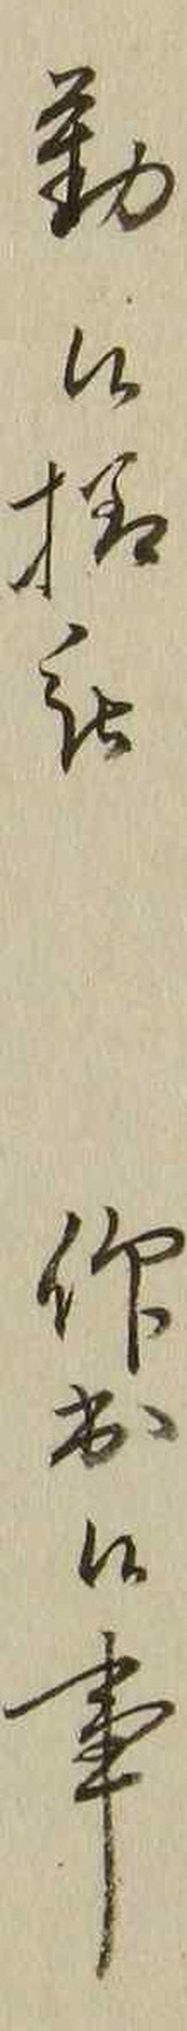勤候様被仰出候事
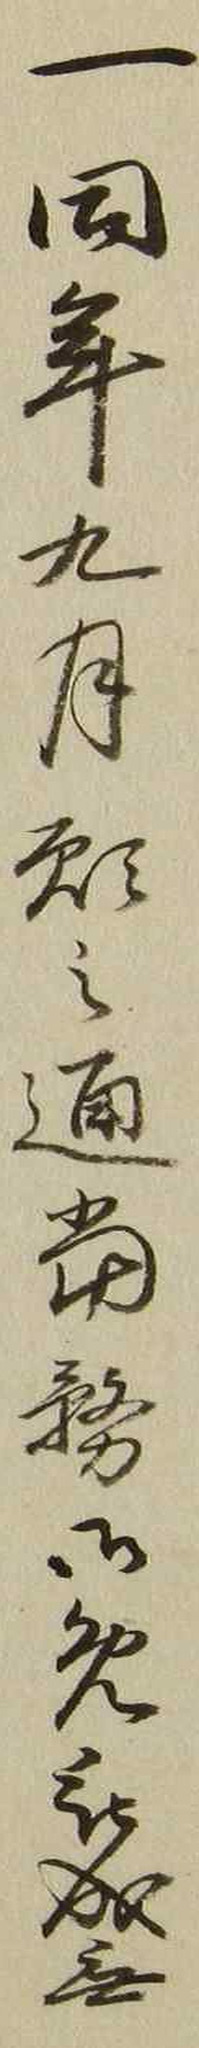一同年九月願之通当務御免被成無
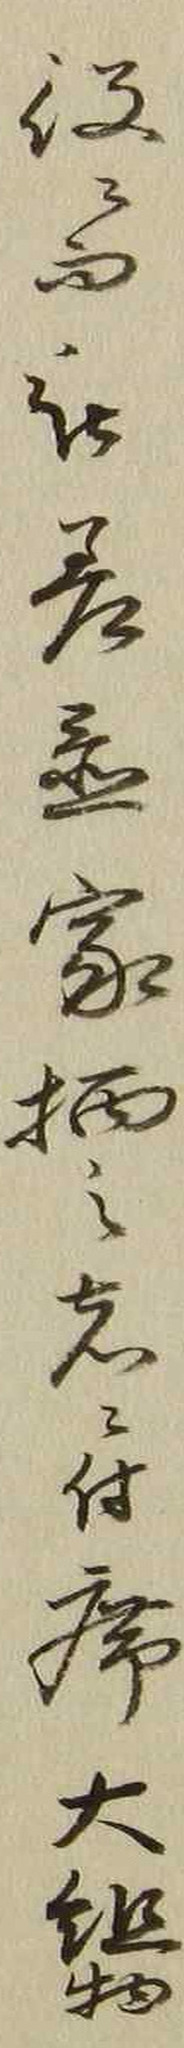役に而被差置家柄之者に付席大組物
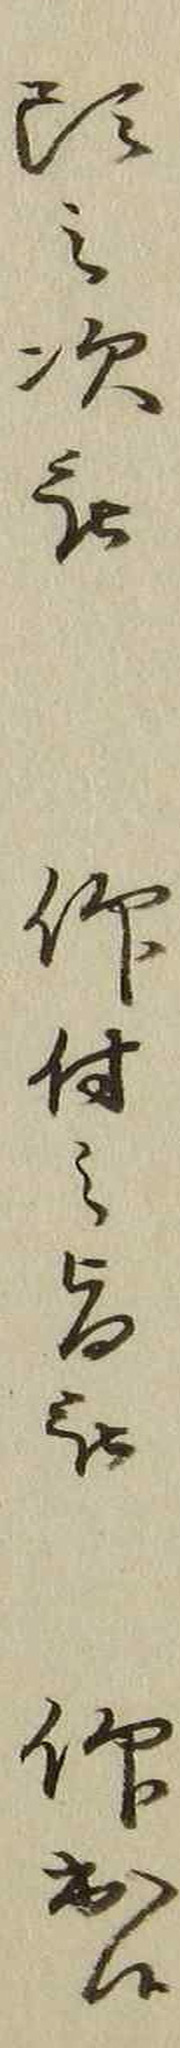頭之次被仰付之旨被仰出候
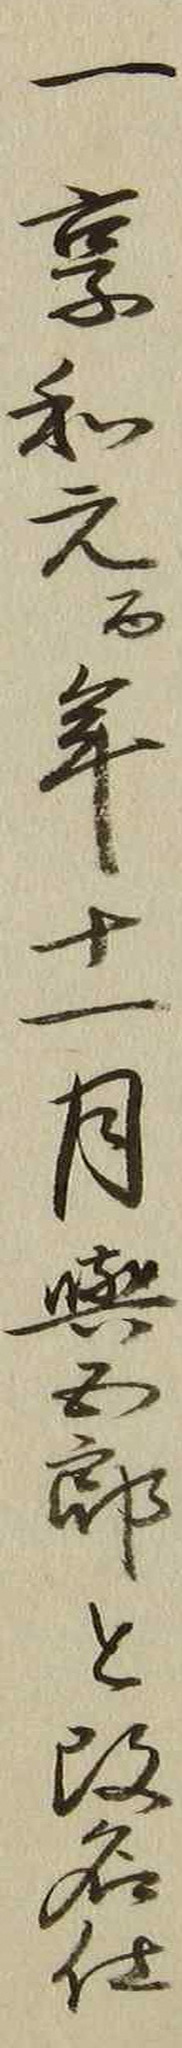一享和元酉年十一月輿五郎と改名仕
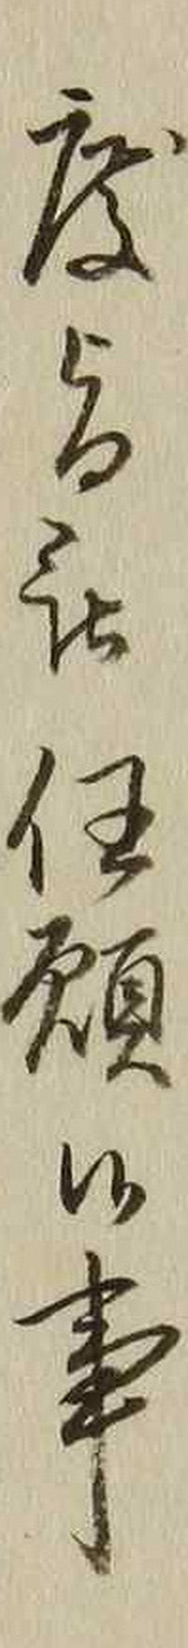度旨被任願候事
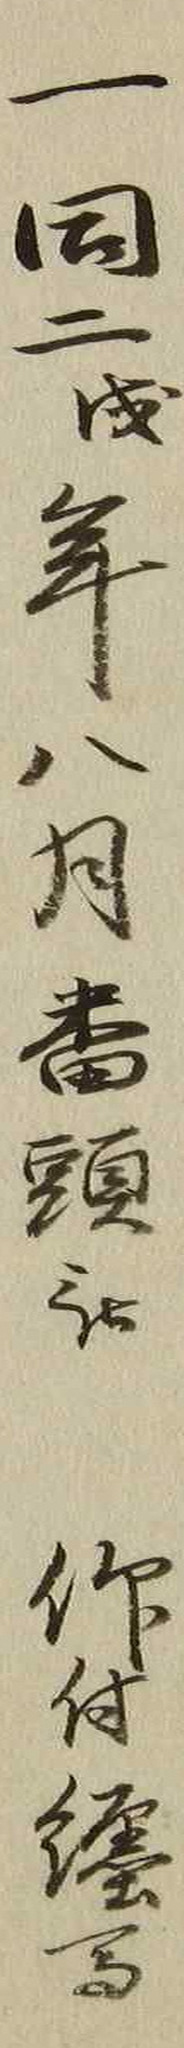一同二戌年八月番頭被仰付纏馬
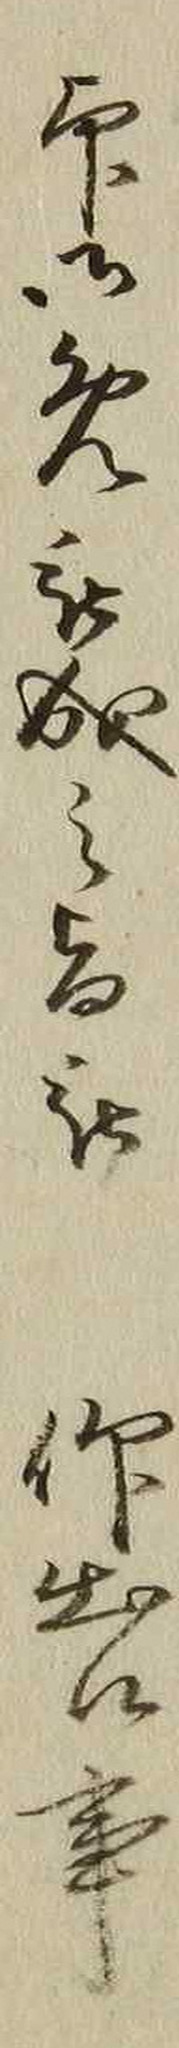印御免被成之旨被仰出候事
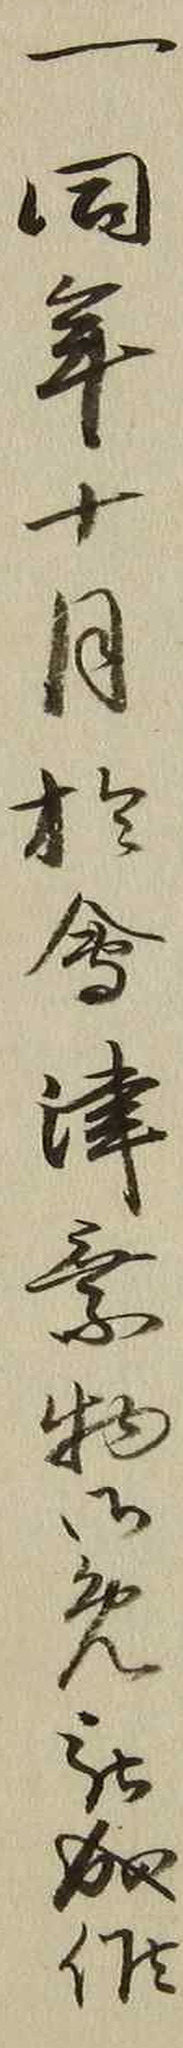一同年十月於会津乗物御免被成候
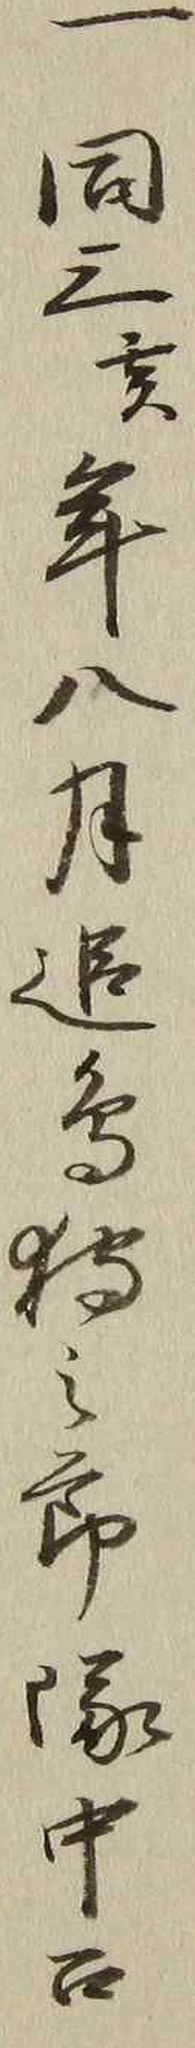一同三亥年八月追鳥狩之節隊中召
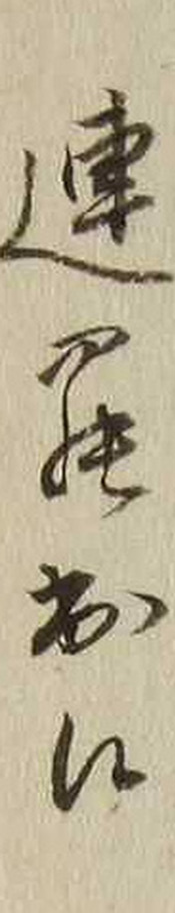連罷出候
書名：諸士系譜　巻之133　た之部9
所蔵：会津若松市立会津図書館
